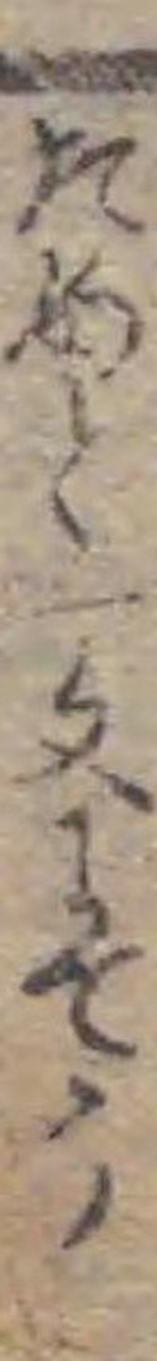ためと一文にてう
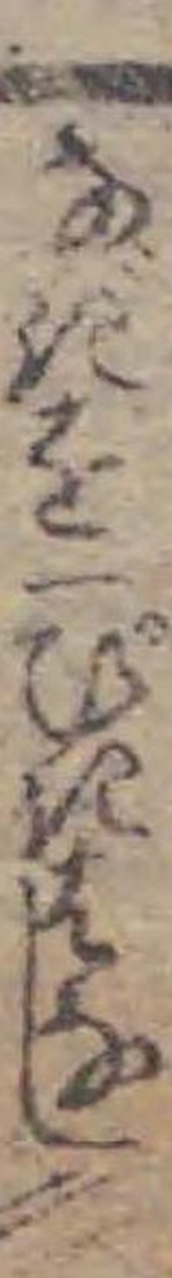なぎを一ぴきはなし
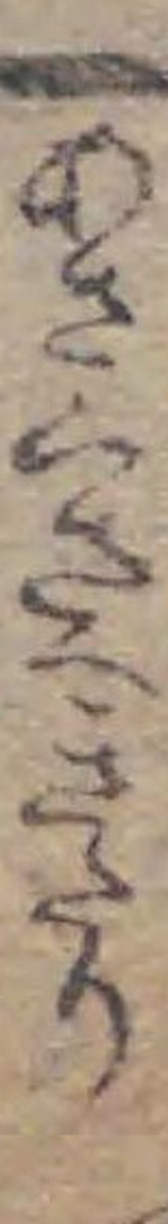あさくさへきたり
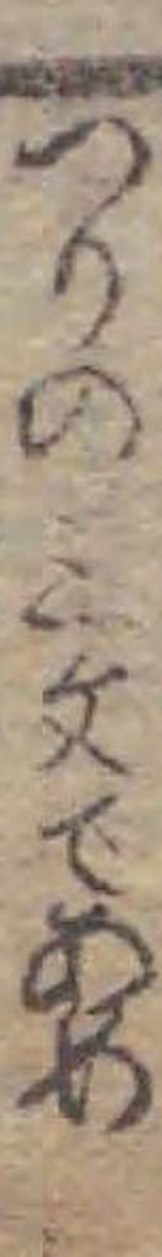つりの三文であめ
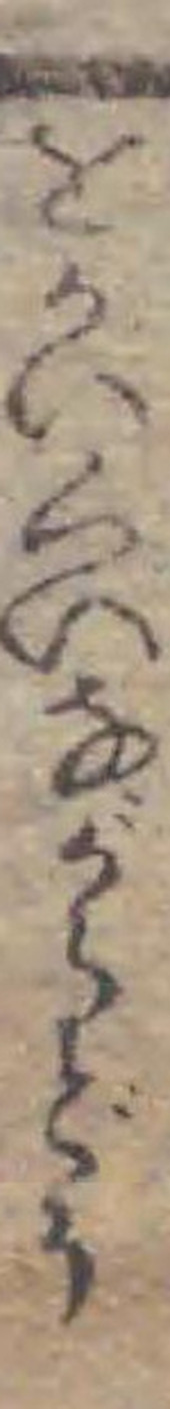をかいくいながらどふ
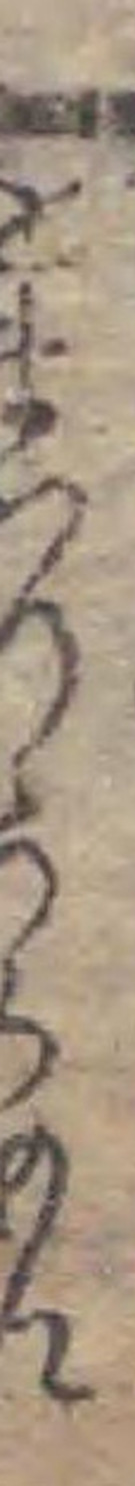をまはりうらもん
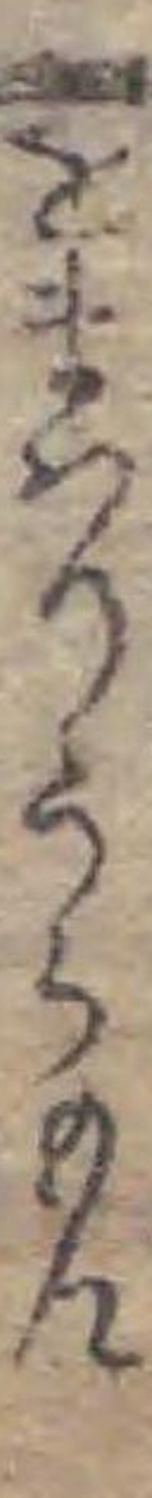をまはりうらもん
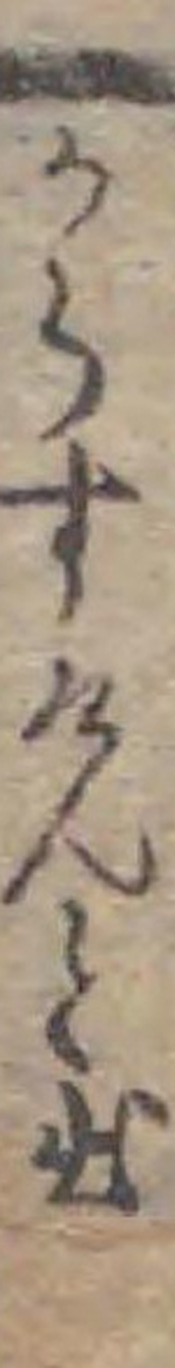からすけんと出
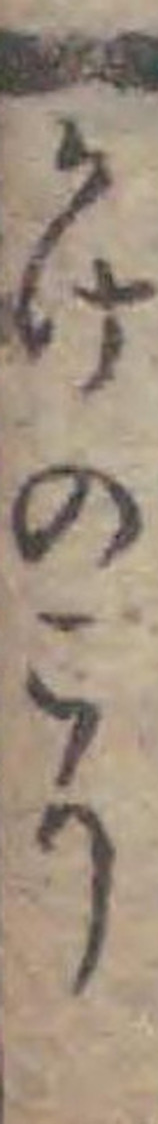かけのこう
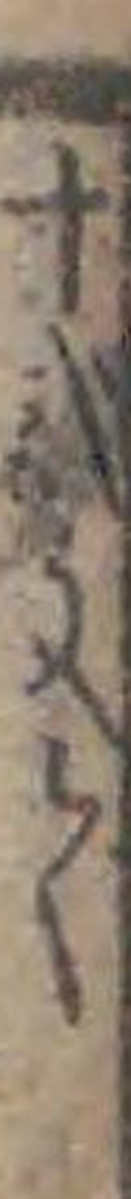十弐文て
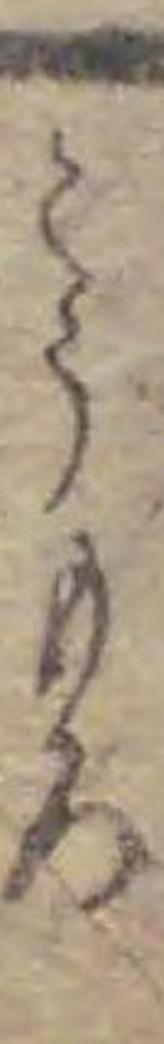とうもろ
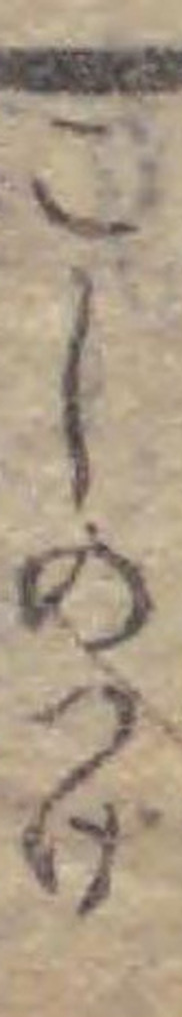こしのつけ
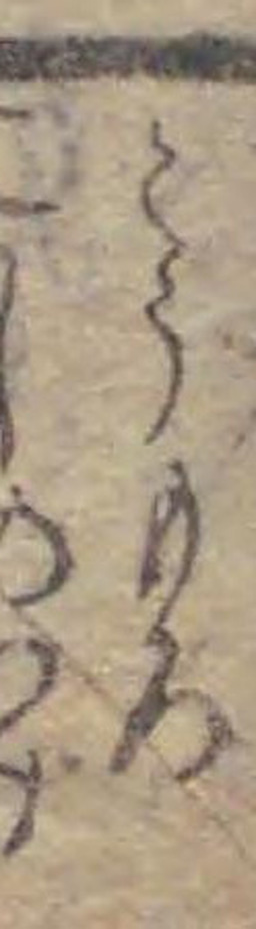こしのつけ
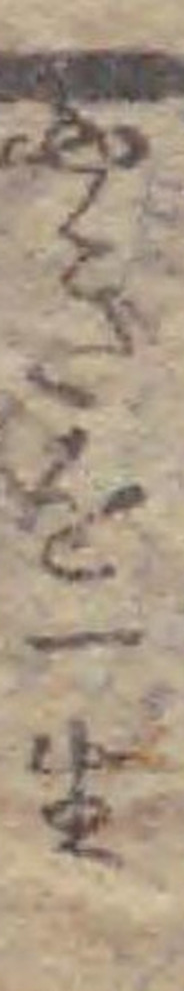やきを一生
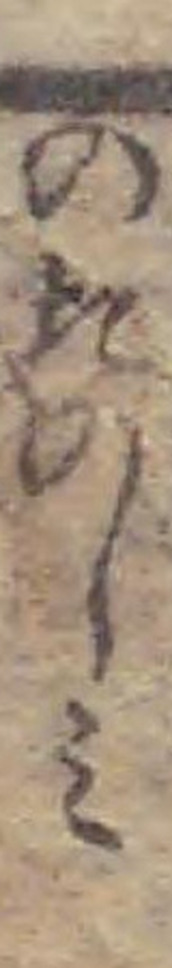のたのしみ
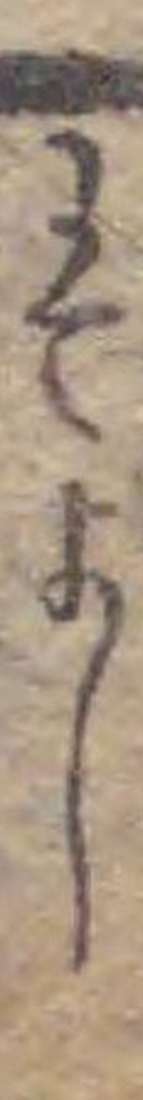にてよし
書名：紺屋百物語 : 3巻
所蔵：国立国会図書館 National Diet Library, JAPAN
